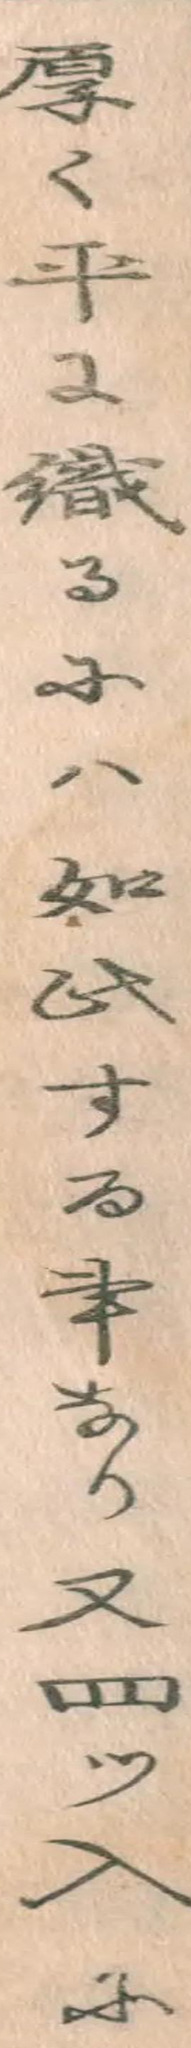厚く平に織るには如此する事なり又四ッ入に
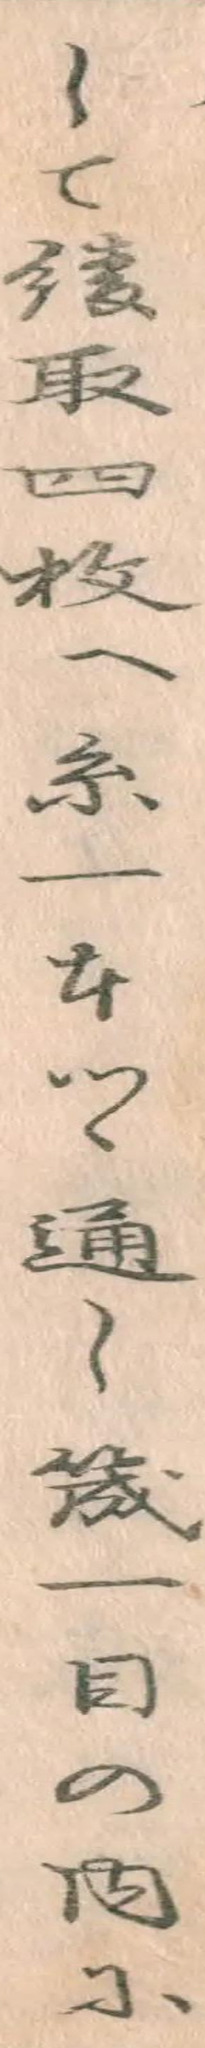して綾取四枚へ糸一本つゝ通し筬一目の内に
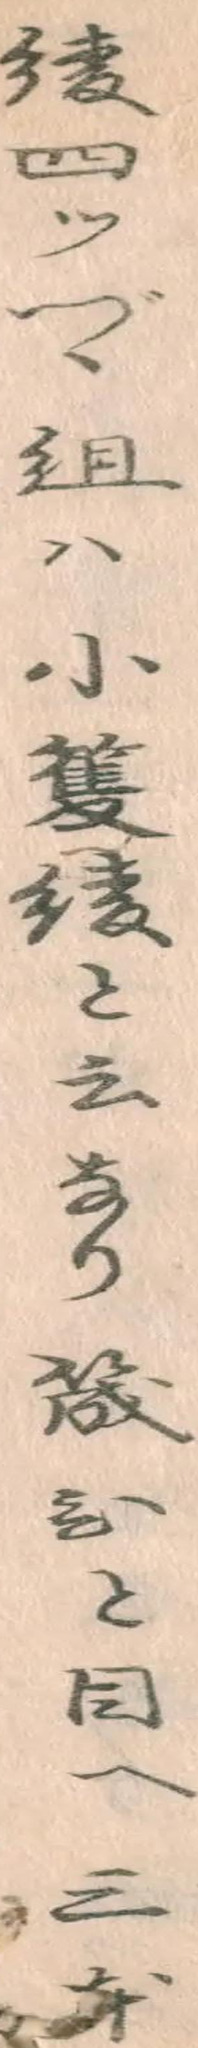綾四ッづゝ組は小篗綾と云なり筬ひと目へ三本
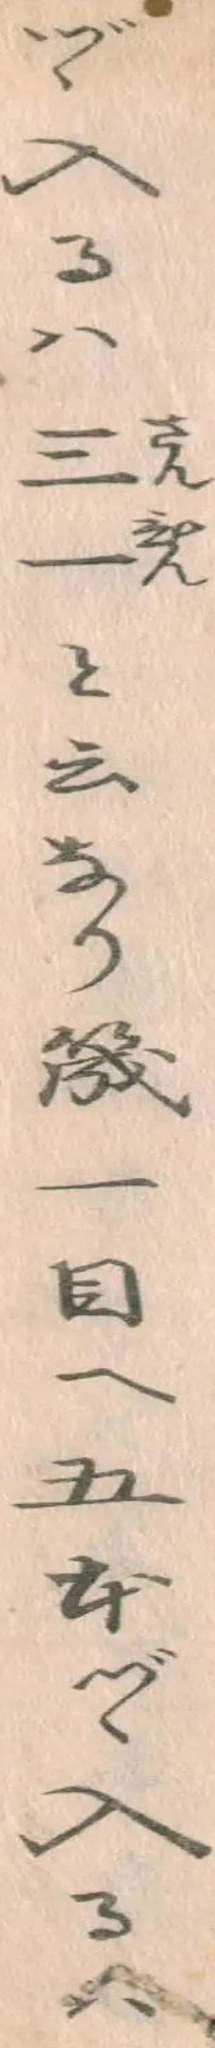づゝ入るは三一と云なり筬一目へ五本づゝ入るは
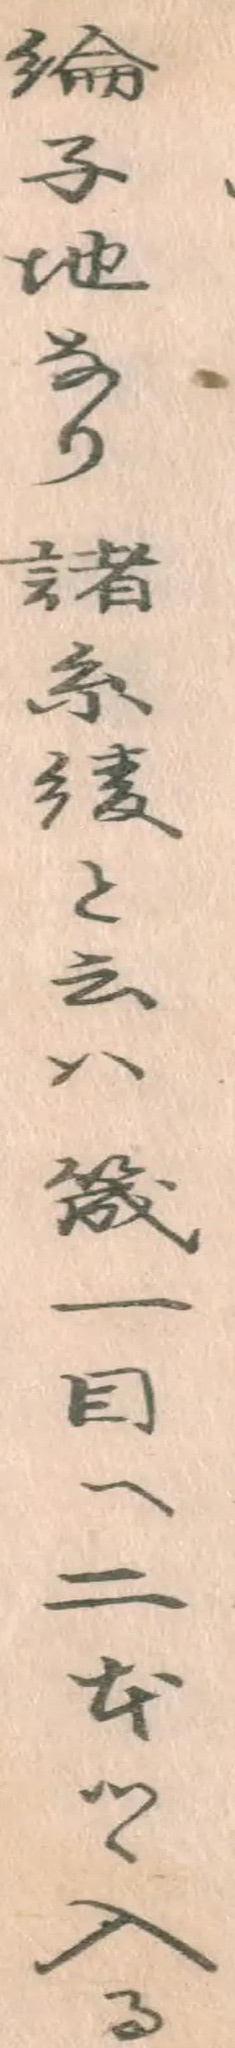綸子地なり諸糸綾と云は筬一目へ二本つゝ入る
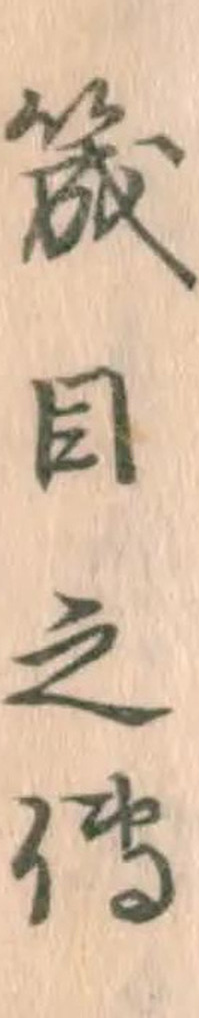筬目之伝
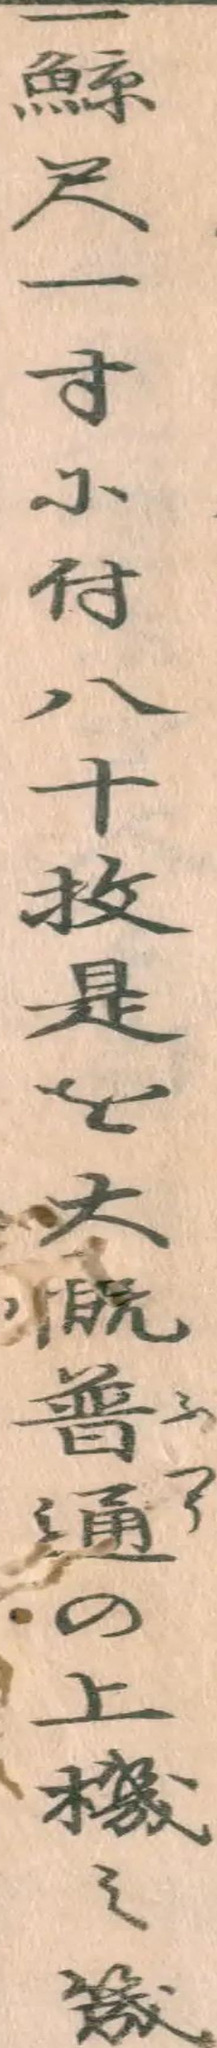一鯨尺一寸に付八十枚是を大慨普通の上機之筬
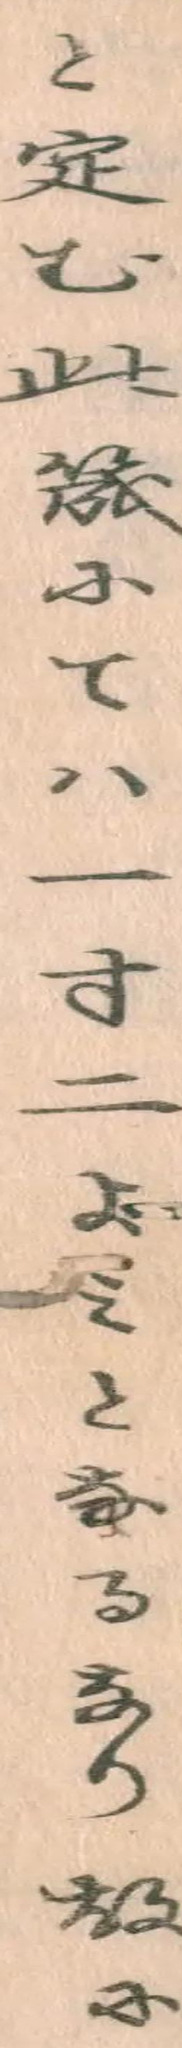と定む此筬にては一寸二よみとなるなり故に
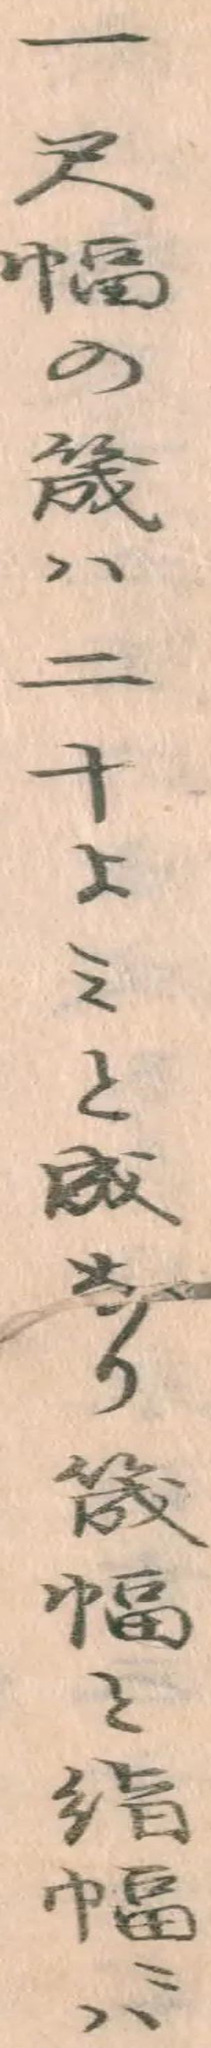一尺幅の筬は二十よみと成なり筬幅を𥿻幅には
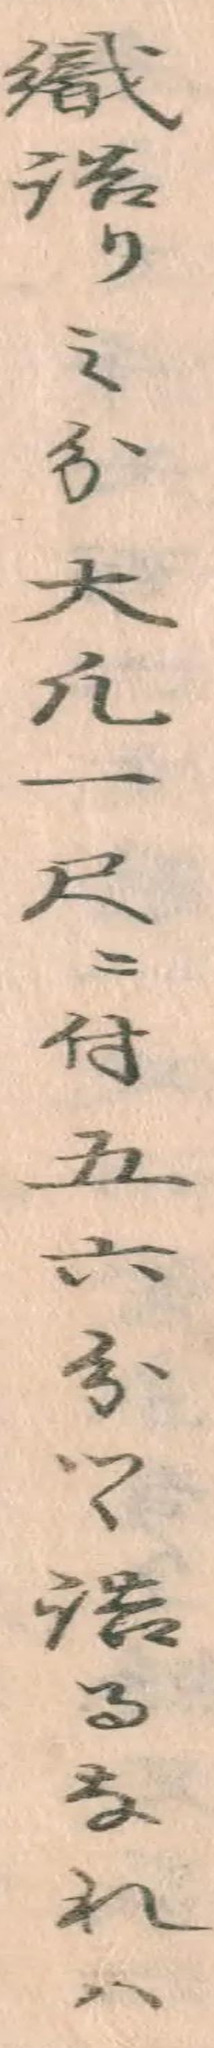織詰り之分大凡一尺に付五六分つゝ詰るなれは
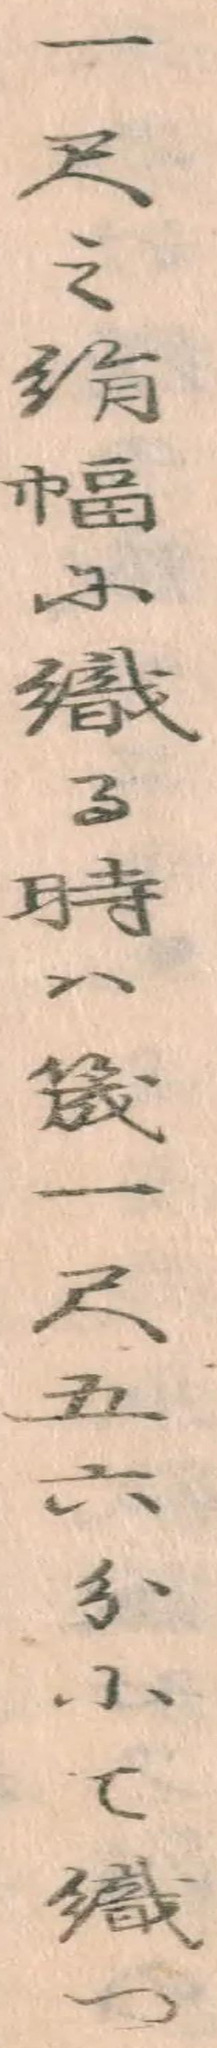一尺之絹幅に織る時は筬一尺五六分にて織つ
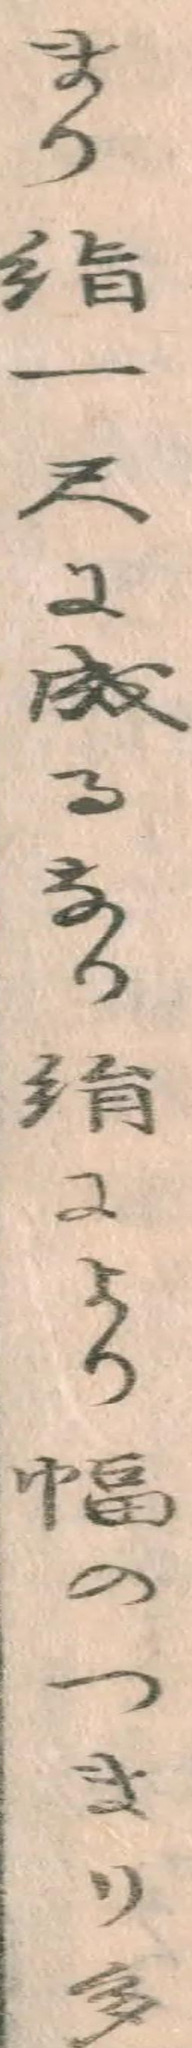まり𥿻一尺に成るなり絹により幅のつまり多
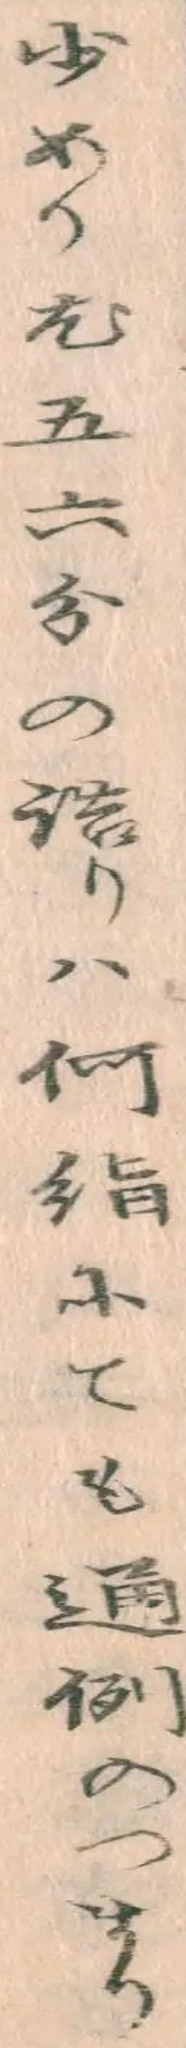少あり尤五六分の詰りは何𥿻にても通例のつまり
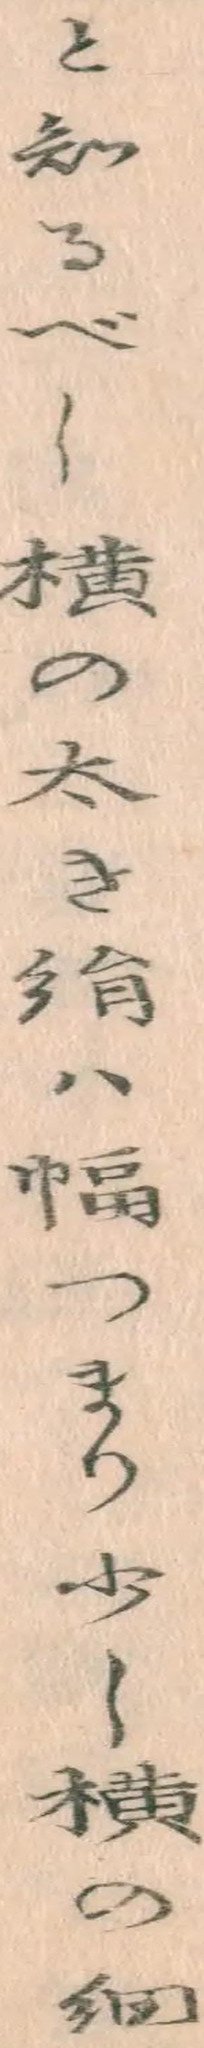と知るべし横の太き絹は幅つまり少し横の細
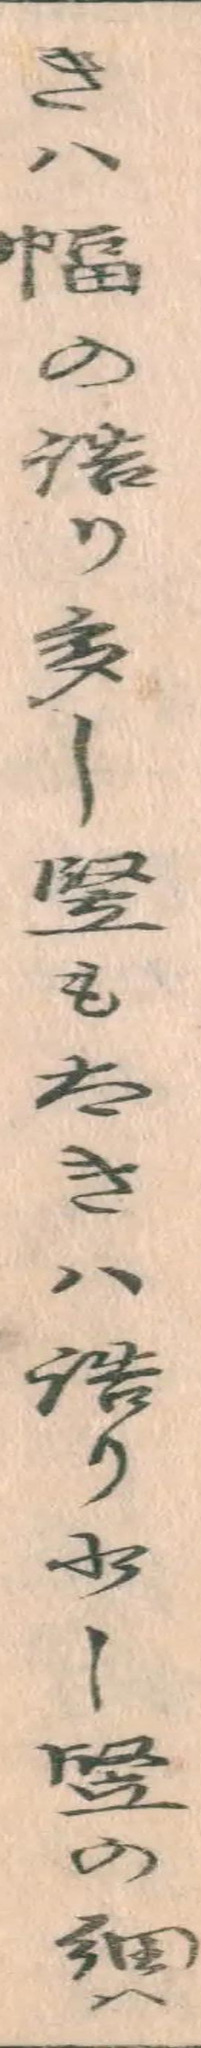きは幅の詰り多し竪も太きは詰り少し竪の細は
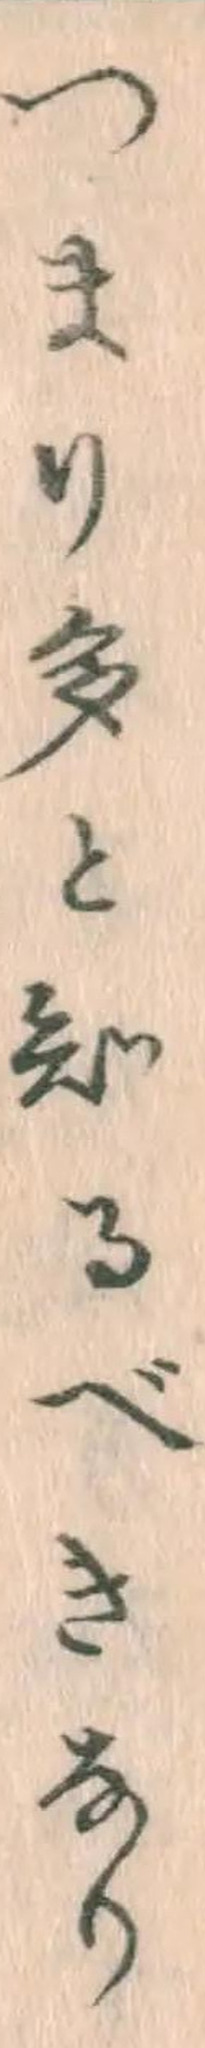つまり多と知るべきなり
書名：機織彙編 5巻. [2]
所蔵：国立国会図書館 National Diet Library, JAPAN
